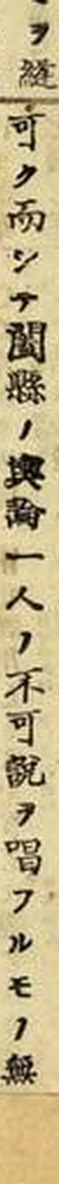可ク而シテ闔縣ノ墺論一人ノ不可説ヲ唱フルモノ無
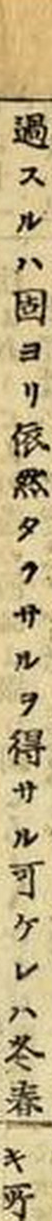過スルハ固ヨリ依然タラサルヲ得サル可ケレハ冬春
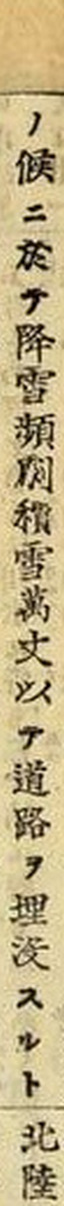ノ候ニ於テ降雪頻同積雪萬丈以テ道路ヲ埋没スルト
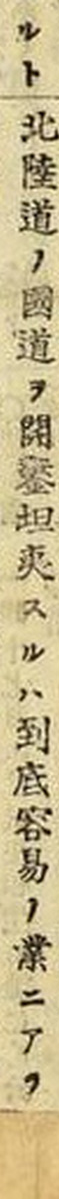北陸道ノ國道ヲ開鑿担夷スルハ到底容易ノ業ニアラ
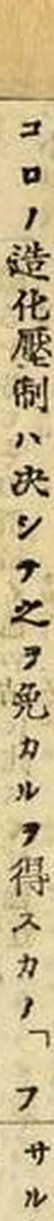コロノ造化壓制ハ決シテ之ヲ免カルヲ得スカノ「フ
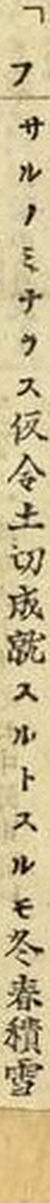サルノミナラス仮令土切成就スルトスルモ冬春積雪
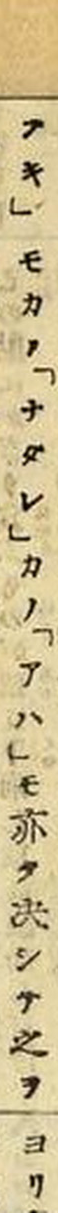テキ」モカノ「ナダレ」カノ「アハ」モ亦タ決シテ之ヲ
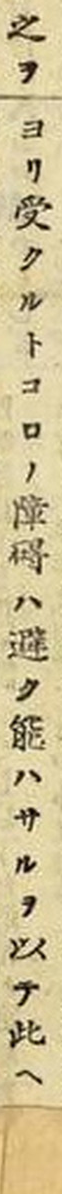ヨリ受クルトコロノ障碍ハ避ク能ハサルヲ以テ此ヘ
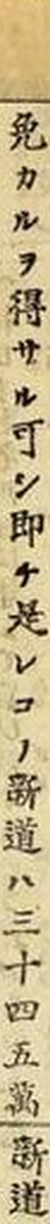免カルヲ得サル可シ即チ是レコノ新道ハ三十四五萬
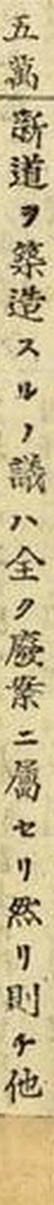新道ヲ築造スルノ議ハ全ク廃業ニ属セリ然リ則チ他
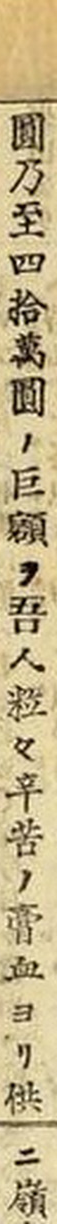圓乃至四拾萬圓ノ巨額ヲ吾人粒々辛苦ノ膏血ヨリ供
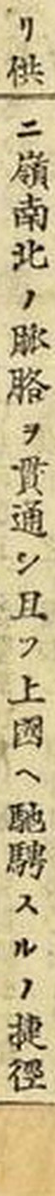ニ嶺南北ノ脈賂ヲ貫通シ且ツ上國へ馳聘スルノ揵徑
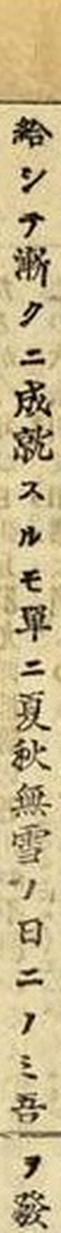給シテ漸クニ成就スルモ單ニ夏秋無雪ノ日ニノミ吾
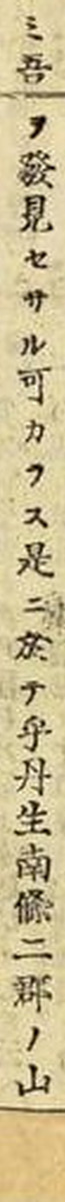ヲ發見セサル可カラス是ニ於テ乎丹生南條ニ郡ノ山
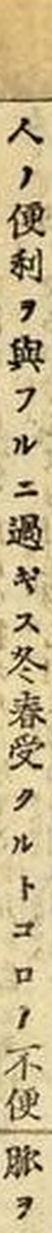人ノ便利ヲ與フルニ過ギス冬春受クルトコロノ不便
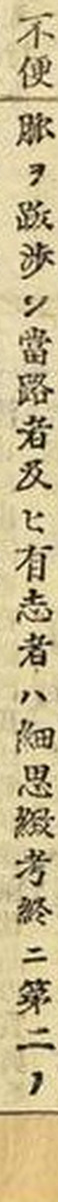脈ヲ跋歩シ當路者及ヒ有志者ハ細思緻考終ニ第二ノ
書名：温古集 五巻
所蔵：福井県文書館 Fukui Prefectural Archives
